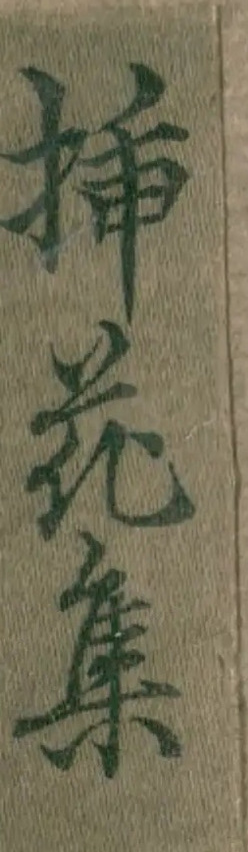挿花集

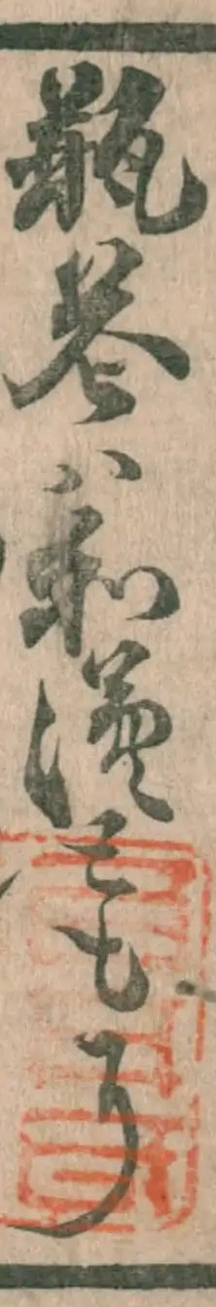瓶花は和漢ともに
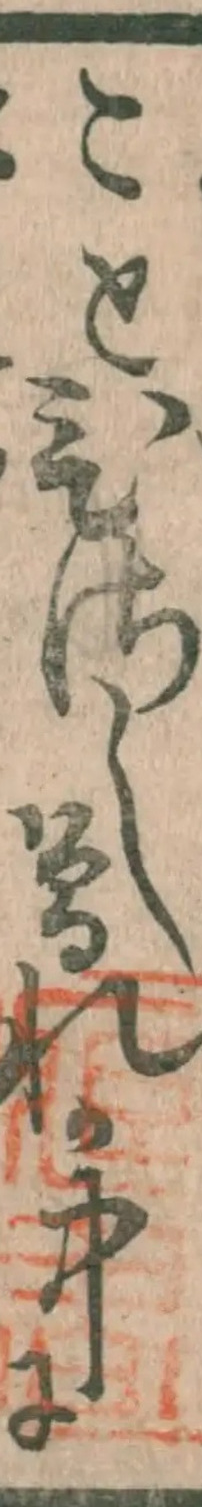ことひさしそれの中に
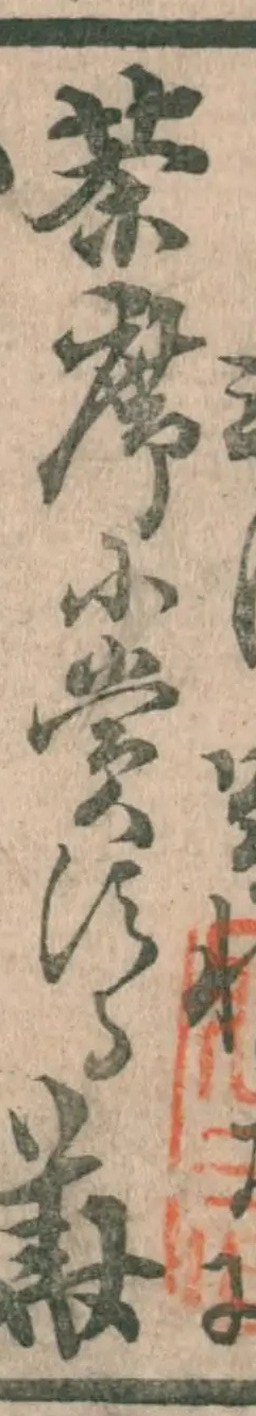茶席に賞する華
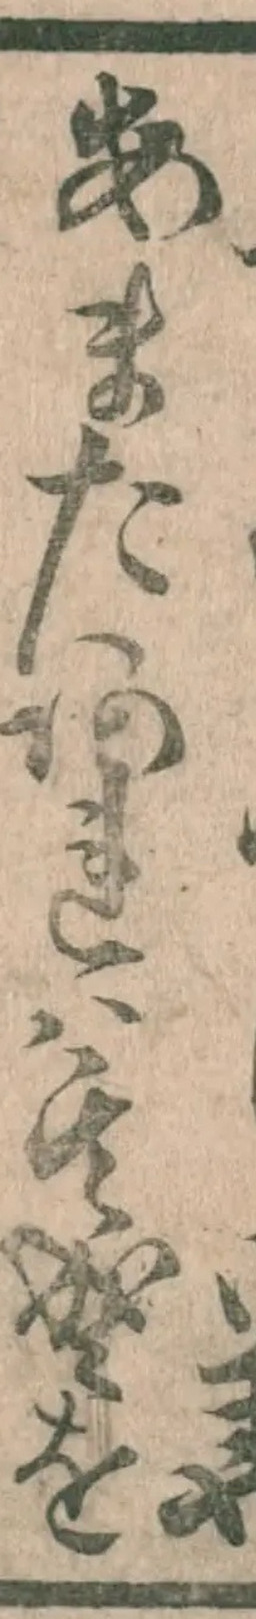あまたあれは其盛を
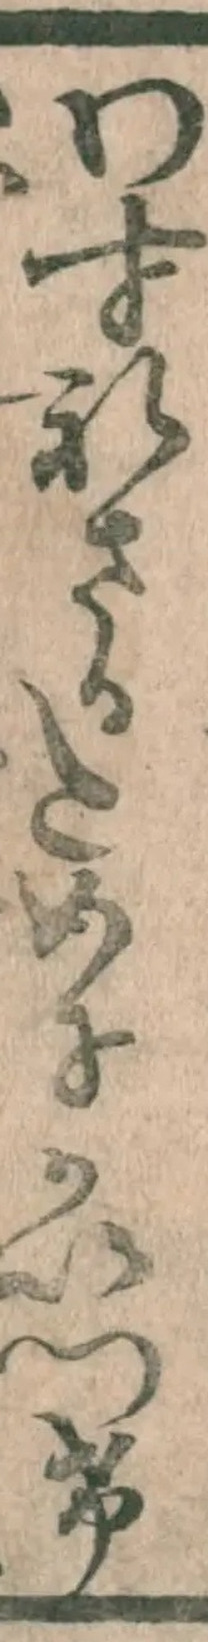わすれさるためにかいつけ
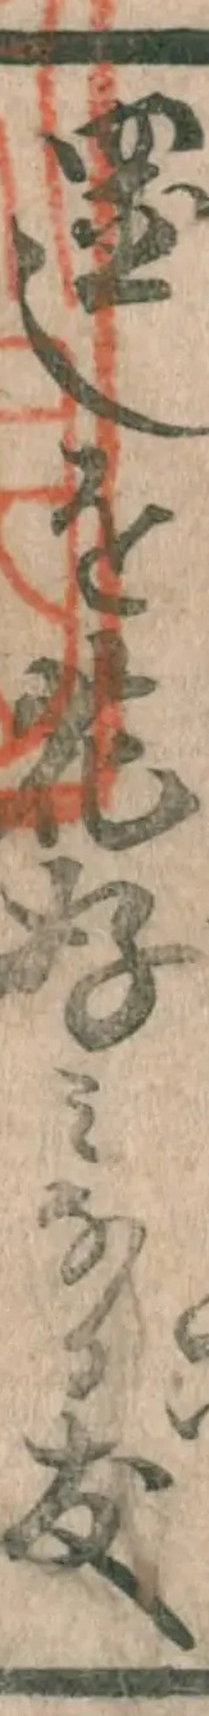置しを花好みなる友
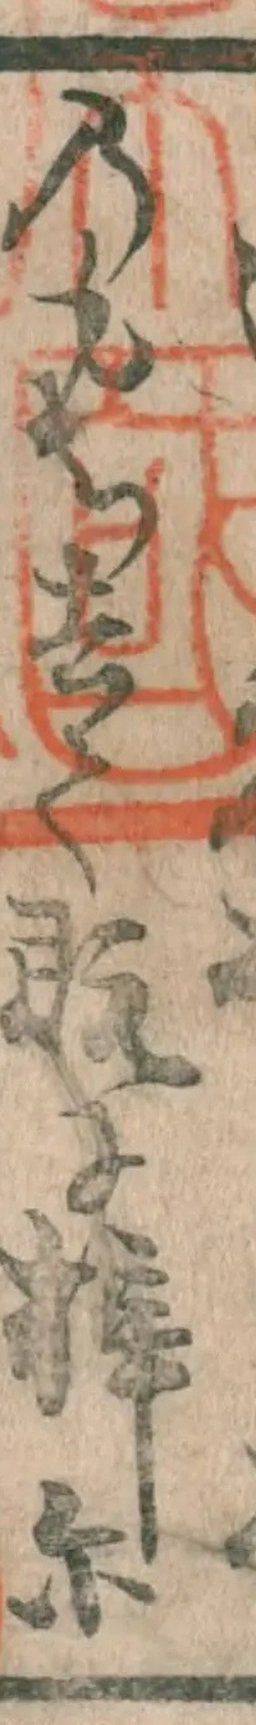のもち去て既に梓に
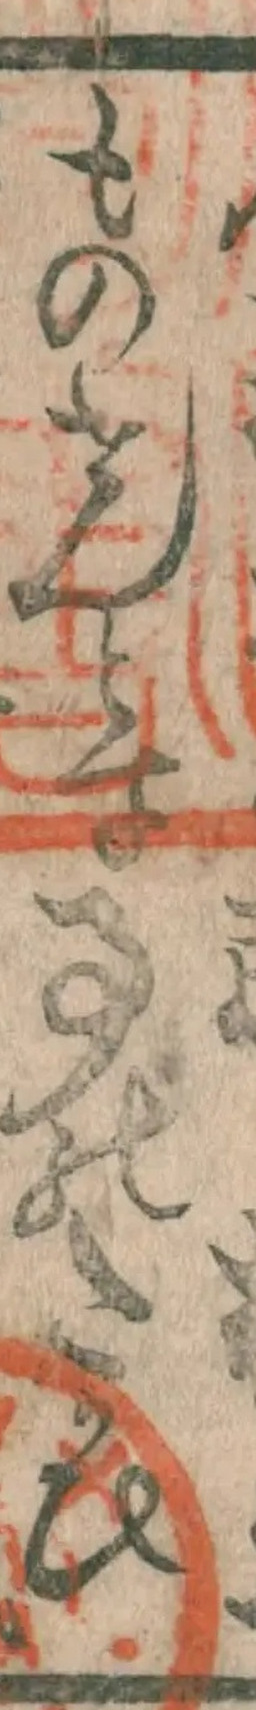もの也とす事のたかひ
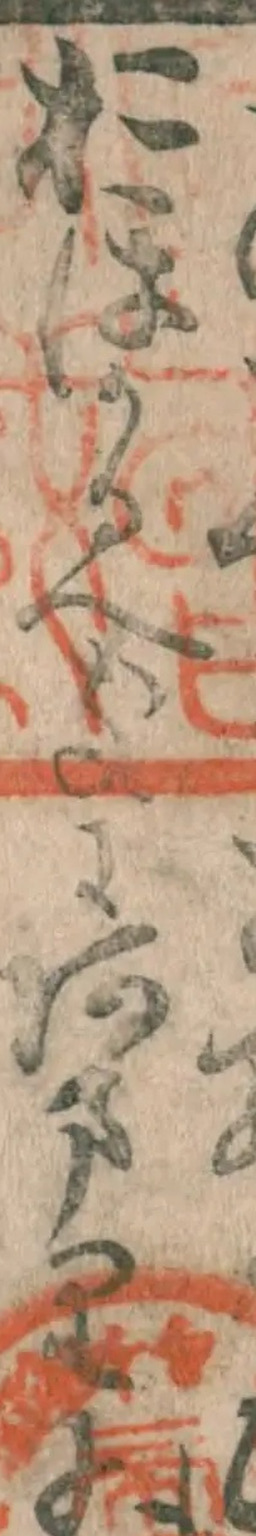おほかるへきにあまりに

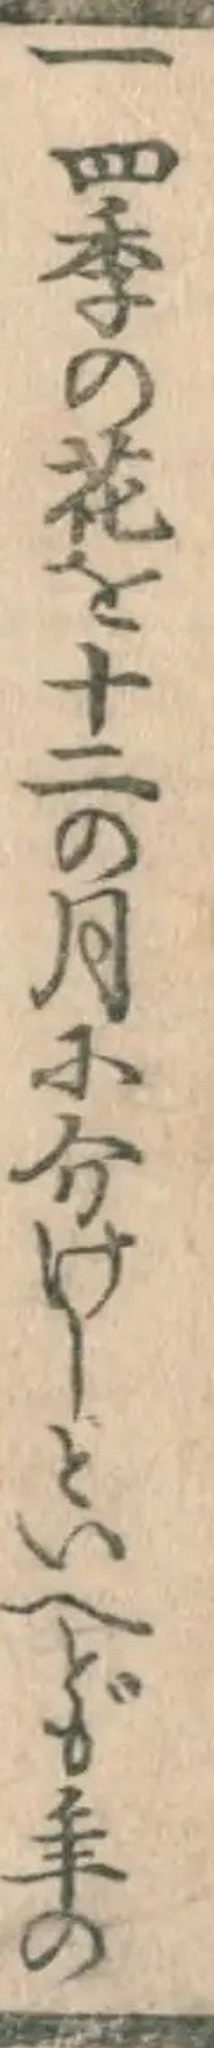一四季の花を十二月に分けしといえども年の
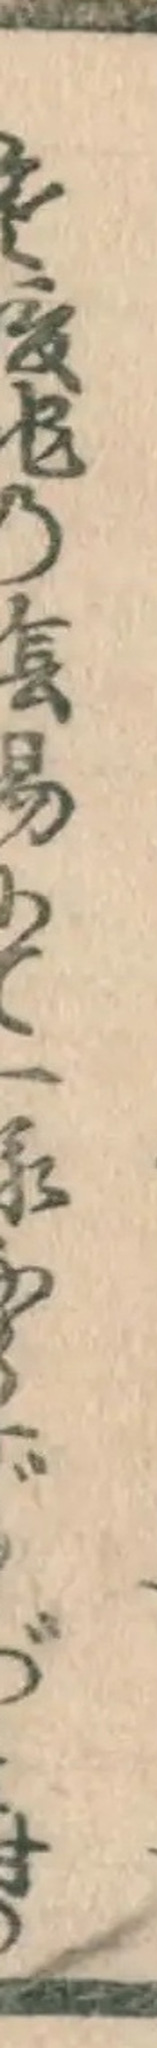春暖地の陰陽にて一様ならずまづ其時の
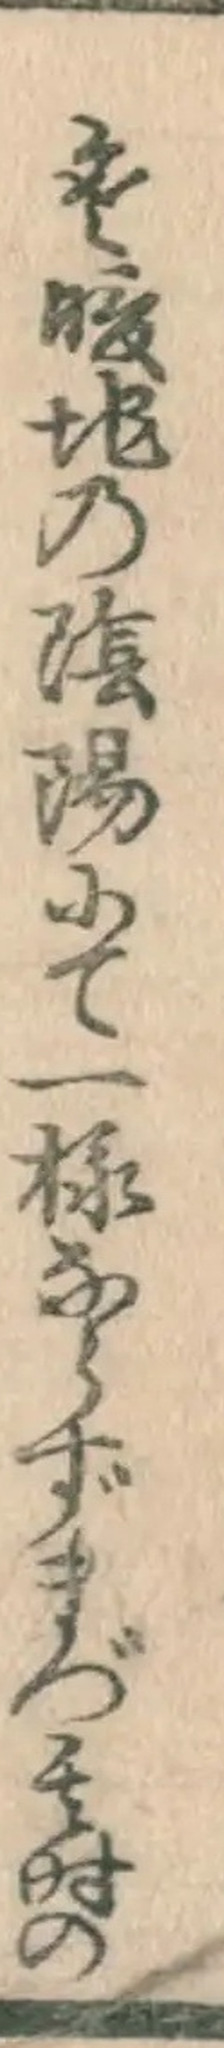春暖地の陰陽にて一様ならずまづ其時の
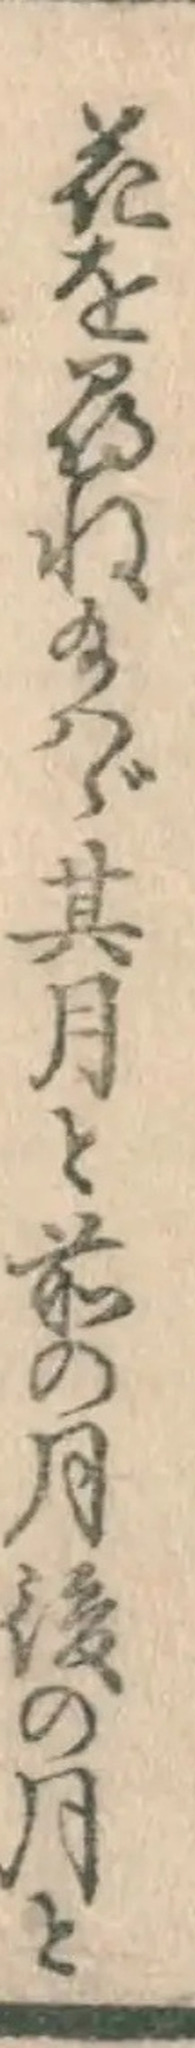花を尋ね給はゞ其月と前の月後の月と
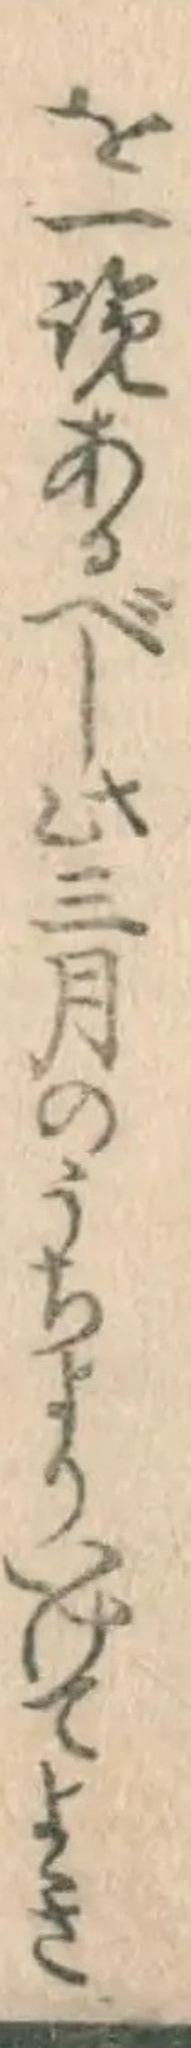を一覧あるべし此三月のうちよりいけてよき
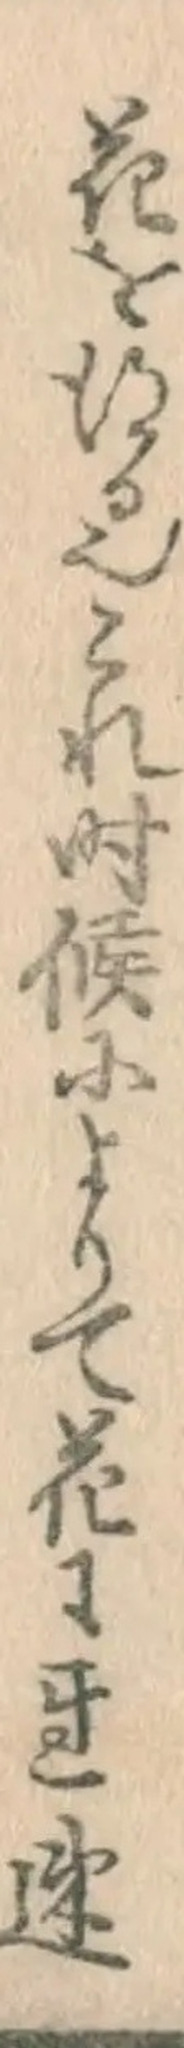花を得る也これ時候によりて花に遅速
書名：茶席挿花集
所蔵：国立国会図書館 National Diet Library, JAPAN
